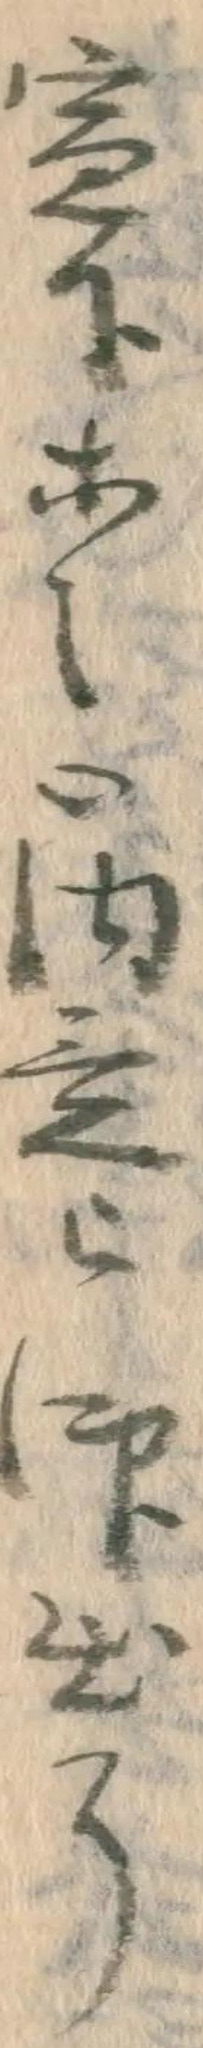宣下等之御内意被仰出了、
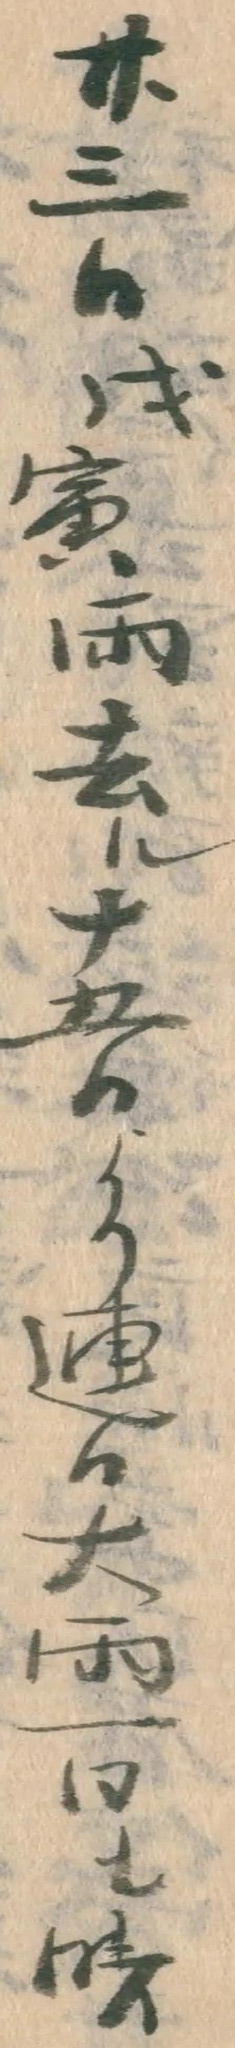廿三日戊寅雨、去ル十五日より連候大雨、一日も晴
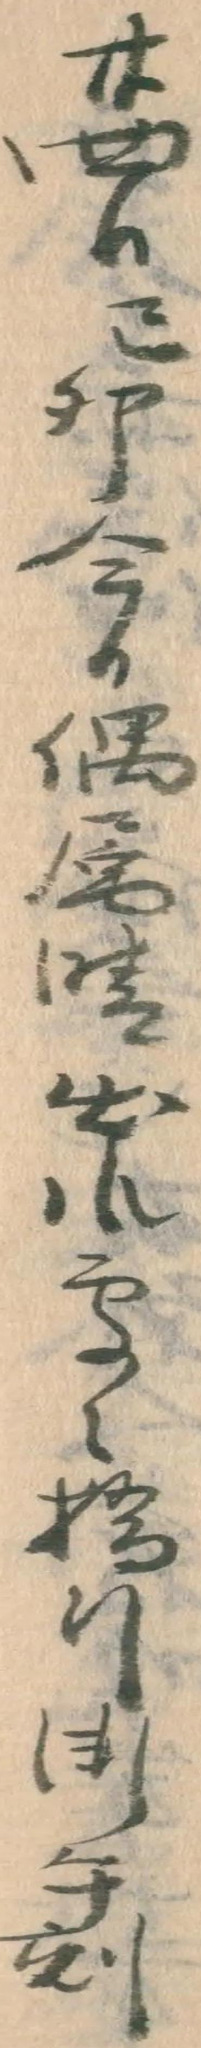廿四日己卯、今日偶属晴、出水處々橋引、漸午刻
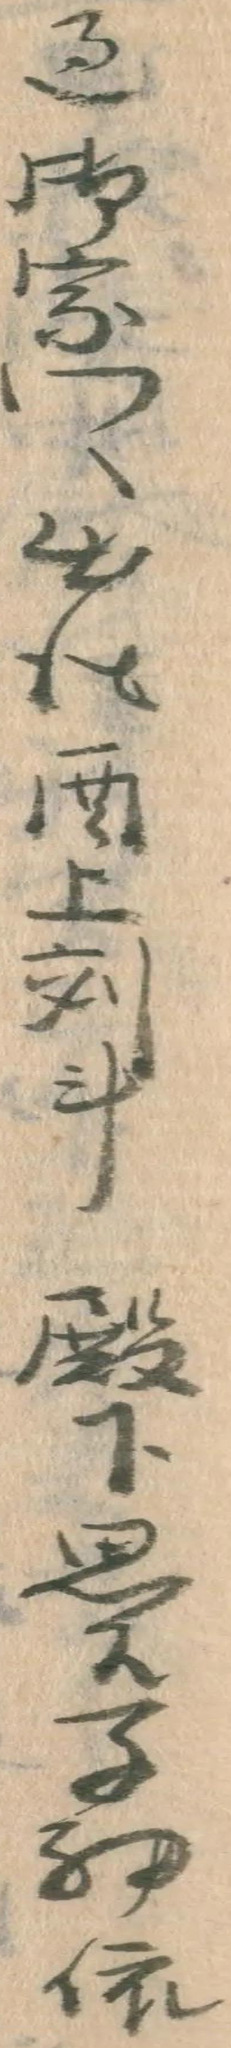過、御家門へ出仕、酉上刻斗、殿下思召子細依
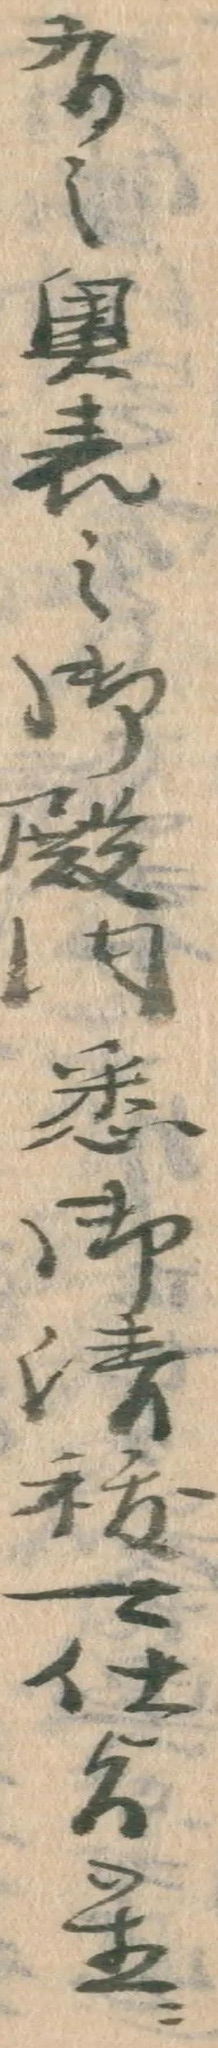有之、奥表之御殿内、悉御清祓可仕旨御直二
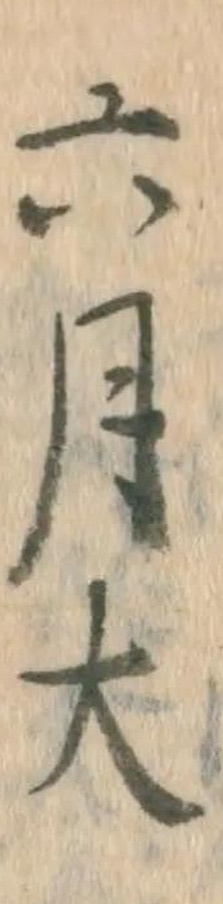六月大
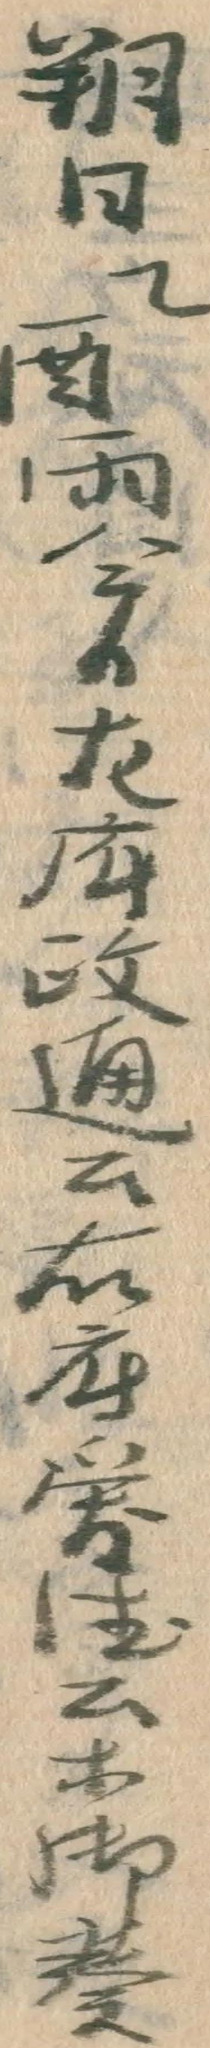朔日乙酉雨、今日左府政通公・右府愛徳公等御奏
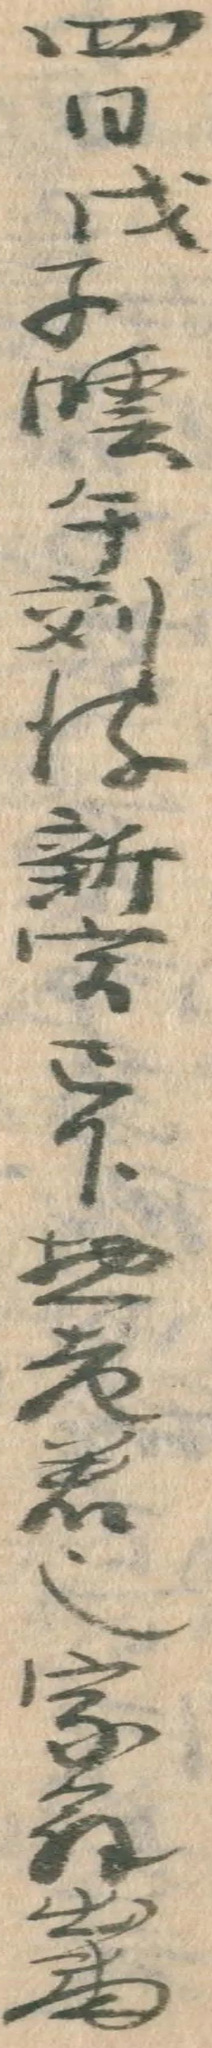四日戊子晴、午刻後新宮已下惣老若也、家翁出番
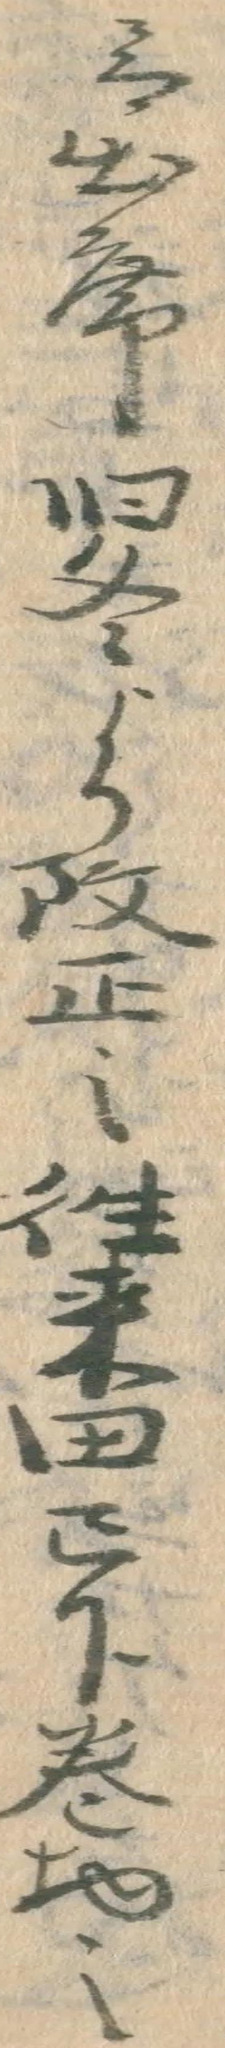ニ而出席、旧冬より改正之往来田已下巻物之
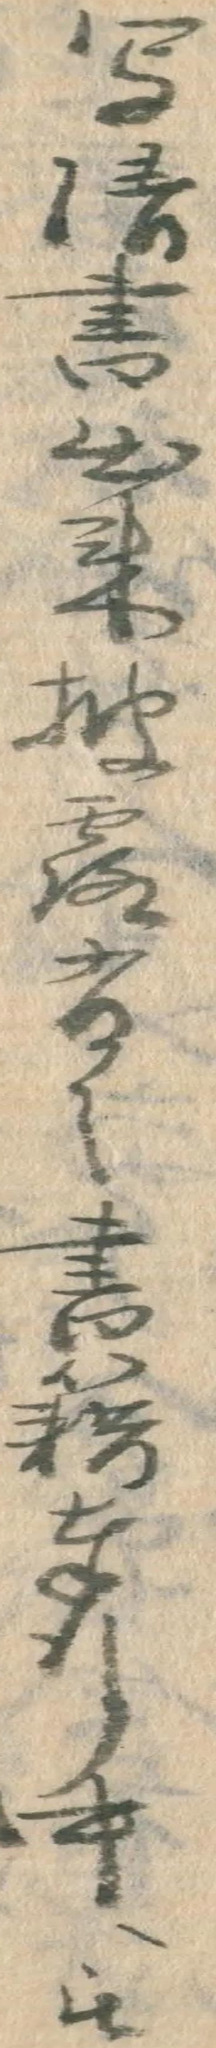写清書出来、披露有之、書籍奉行中へ被
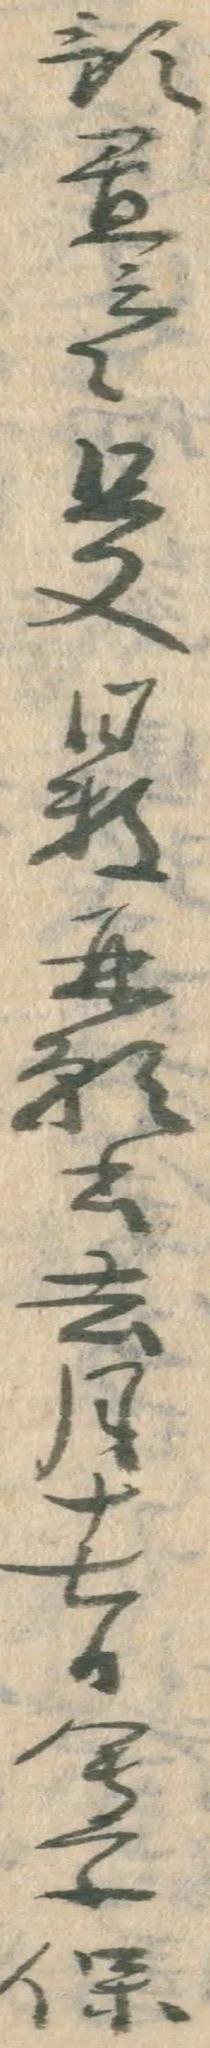預置云々、且又日数再願書、去月十七日會所保
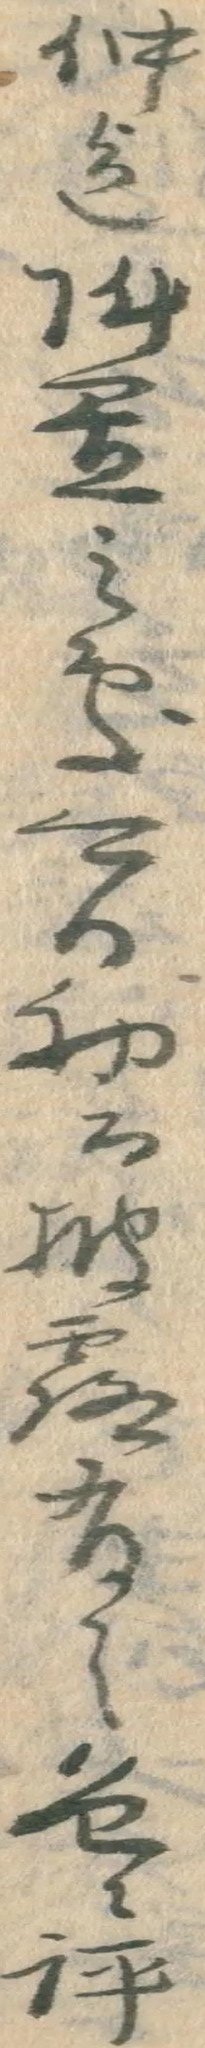仲迄附置之處、今日初而披露有之、色々評

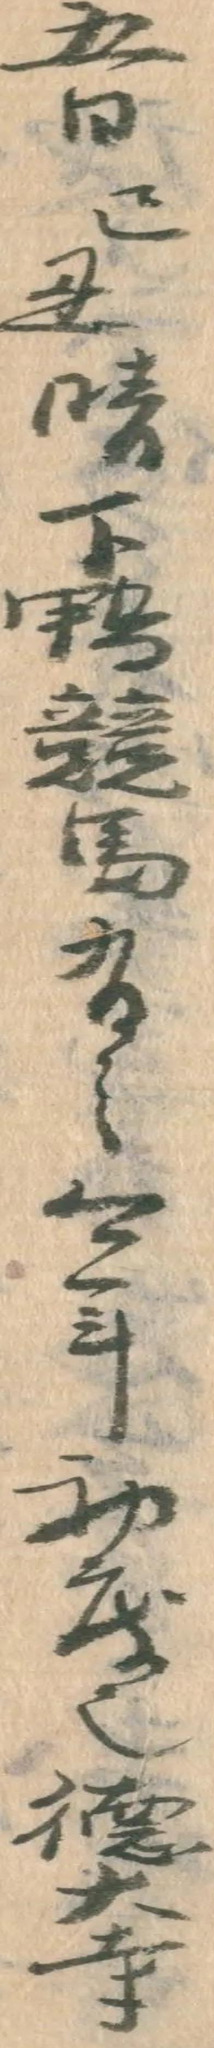五日己丑晴、下鴨競馬有之、今年初度也、徳大寺
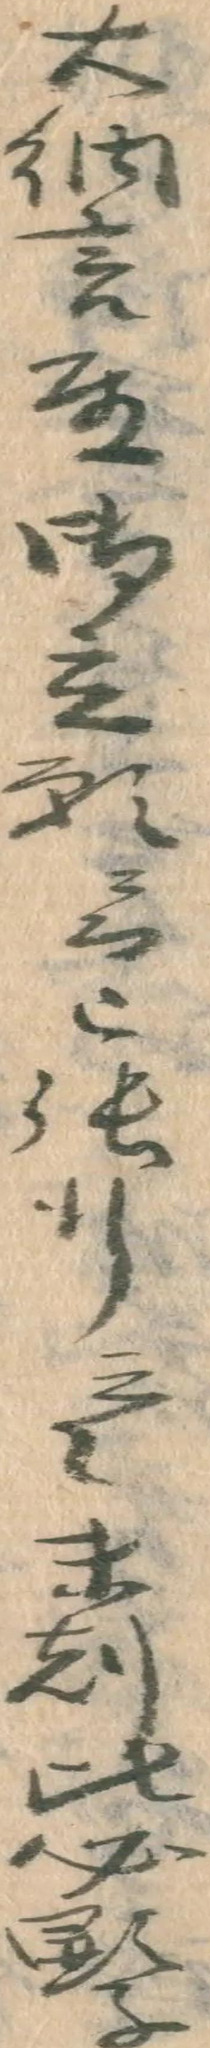大納言殿御立願ニ而被張引云々、未刻此必顕子
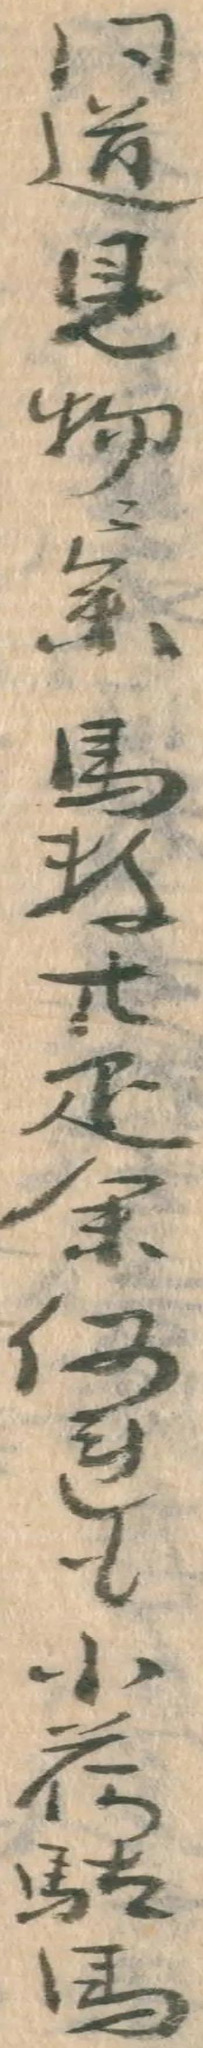同道見物ニ参、馬数廿疋余、何れも小荷駄馬
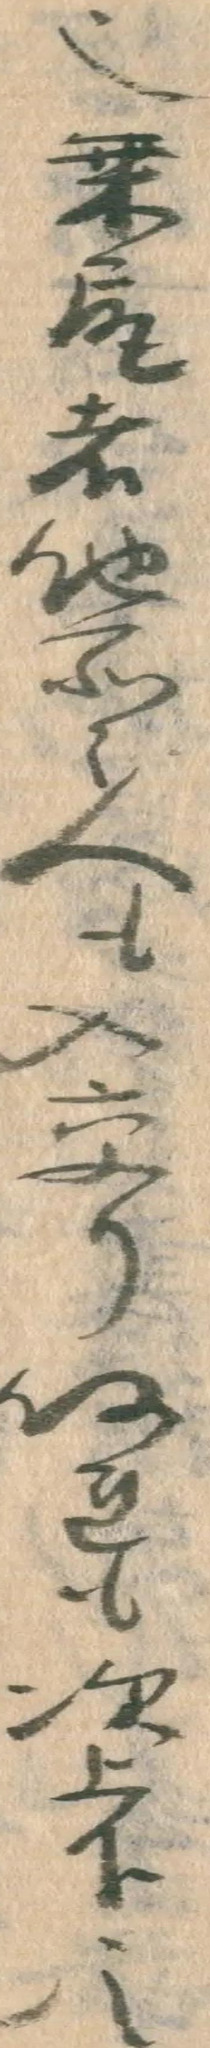也、乗尻者他所之人も入交り侍れも、次上下之
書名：賀茂社記録. 第63冊
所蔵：国立国会図書館 National Diet Library, JAPAN
